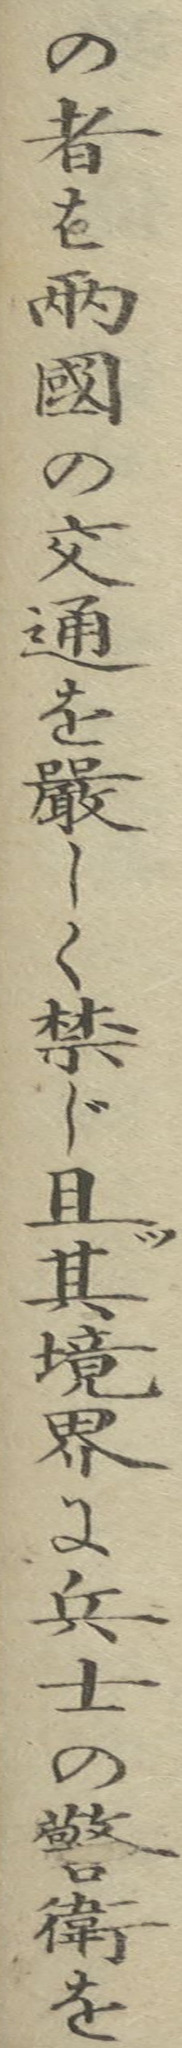の者を両國の交通を厳しく禁じ且其境界に兵士の警衛を
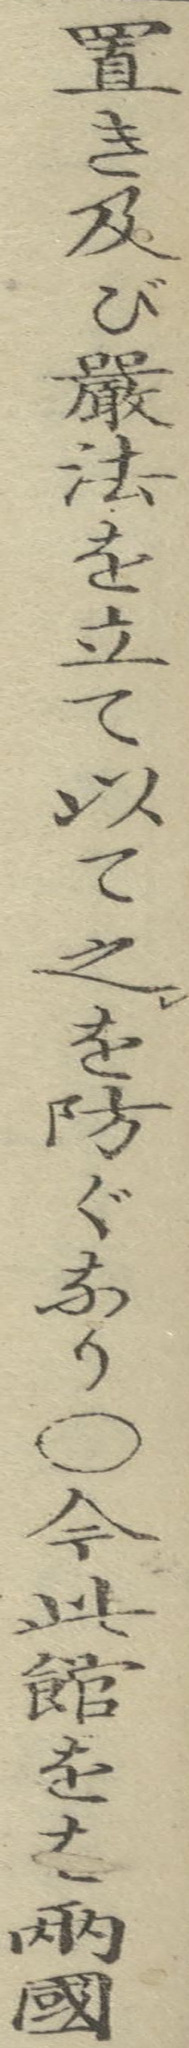置き及び厳法を立て以て之防ぐなり〇今此館をは両國
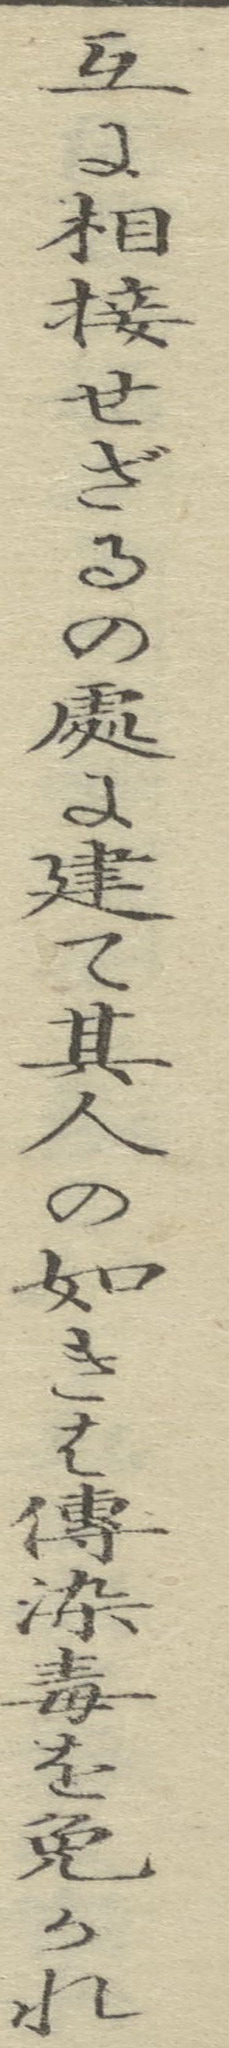互に相接せざるの處に建て其人の如きは傳染毒を免かれ
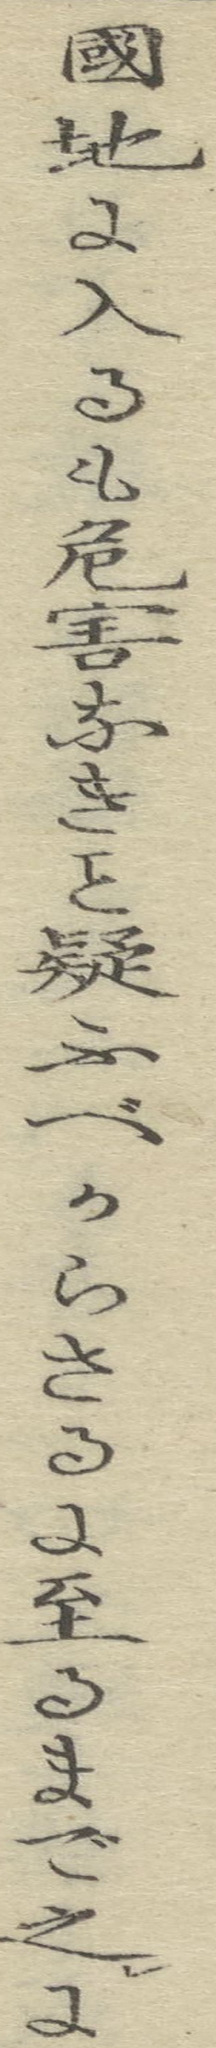國地に入るも危害なきこと疑ふべからさるに至るまで之
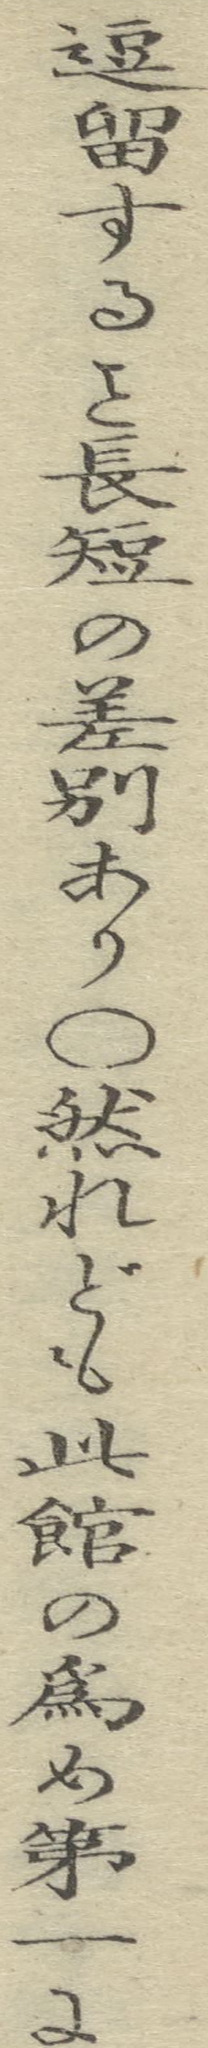逗留すること長短の差別あり〇然れども此館の為め第一に
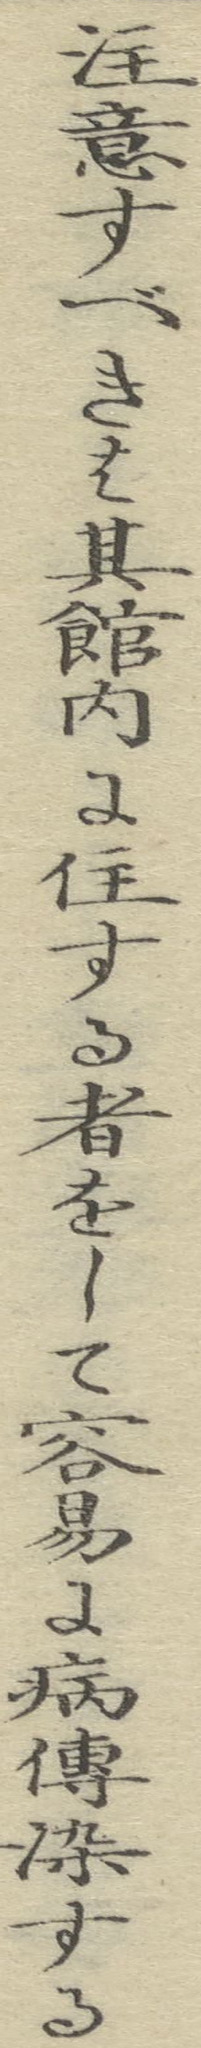注意すべきは其館内に住する者をして容易に病傅染する
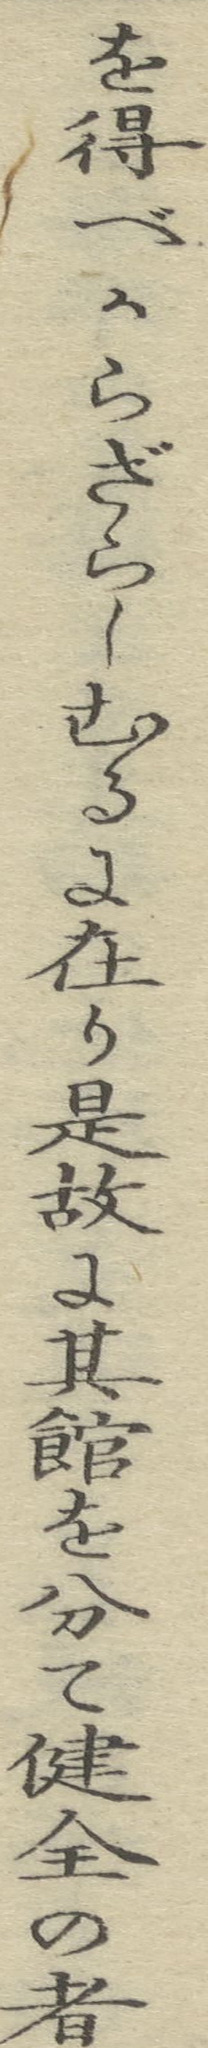を得べからざらしむるに在り是故に其館を分て健全の者
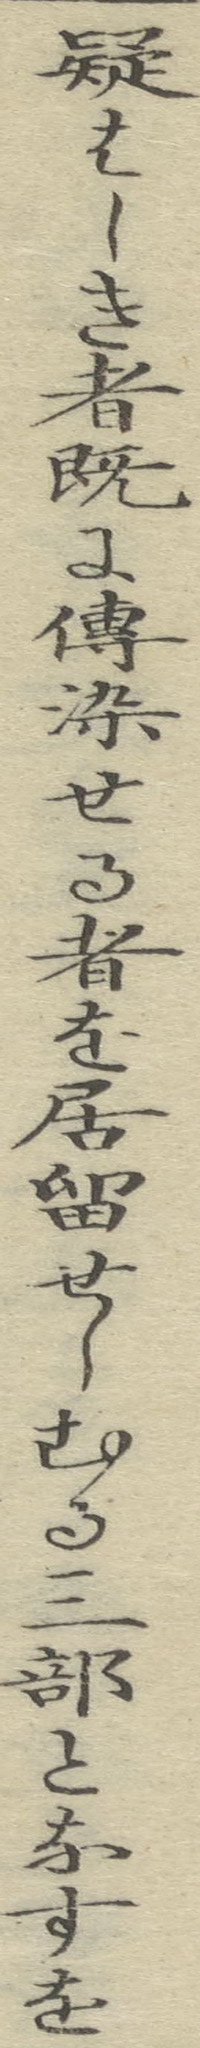疑はしき者既に傅染せる者を居留せしむる三部となすを
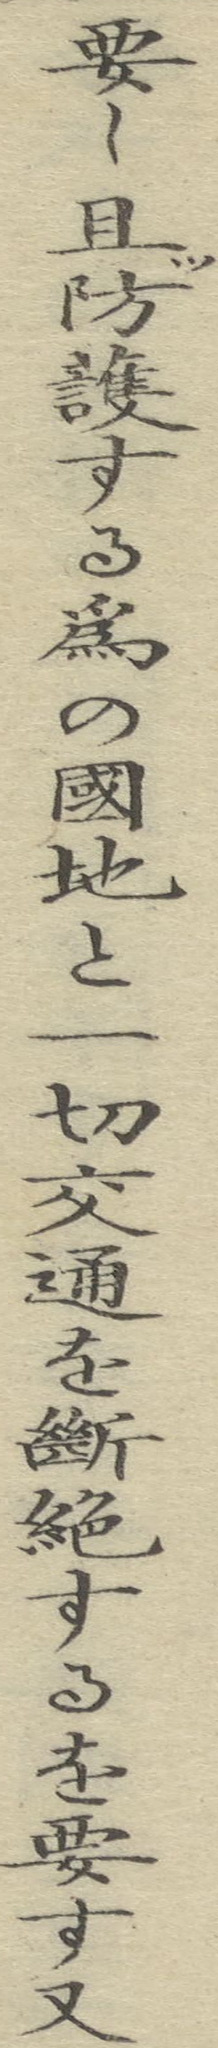要し且防護する為の國地と一切交通を断絶するを要す又
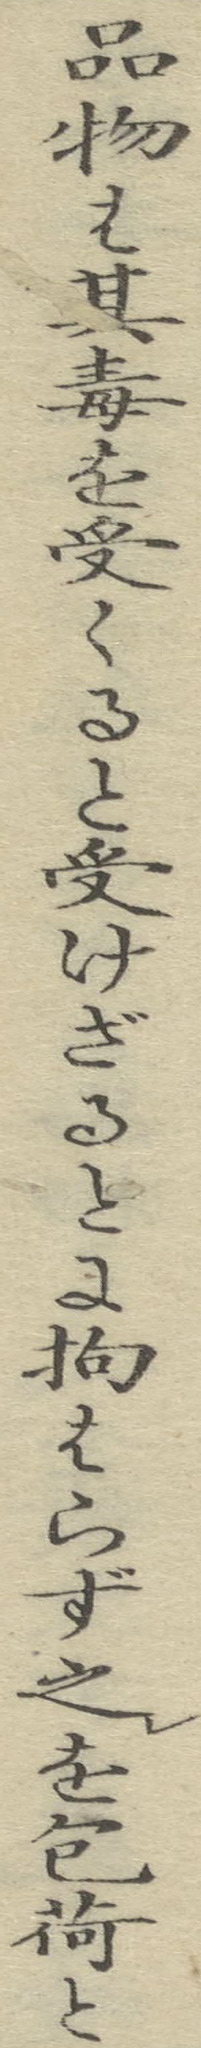品物は其毒を受くると受けざることに拘はらず之包荷と
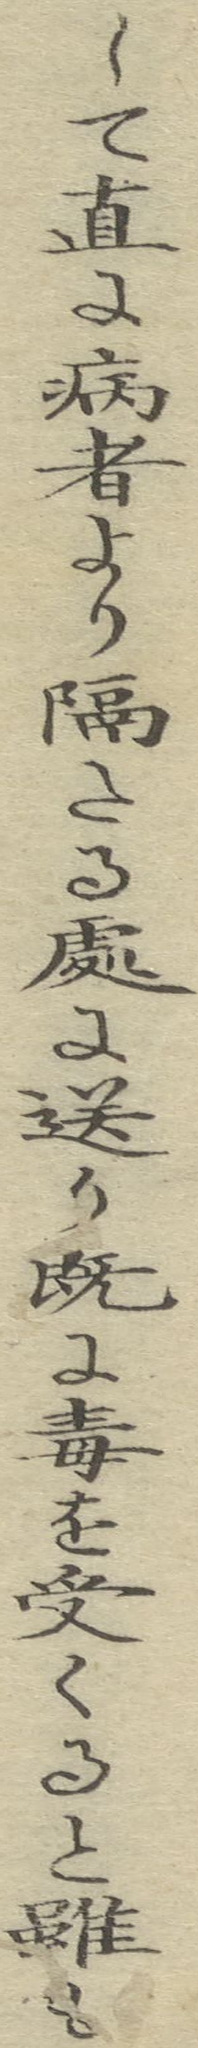して直に病者より隔たる處に送り既に毒を受くると雖も

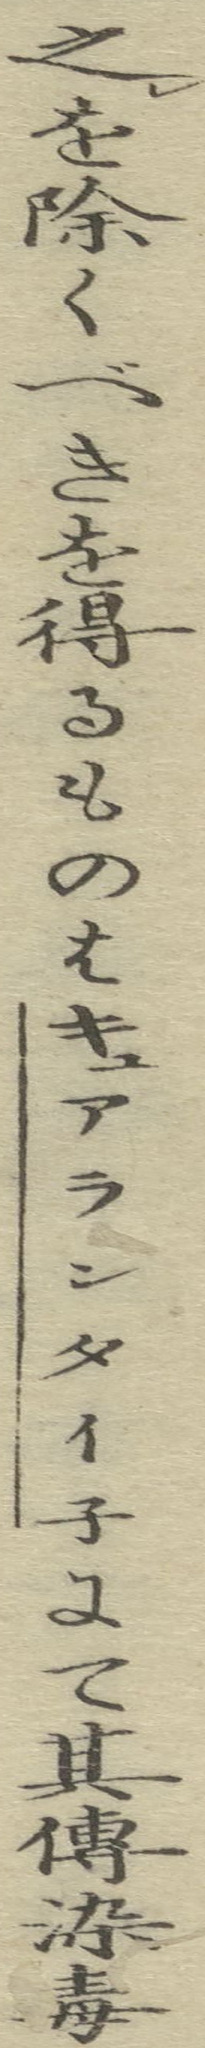之除くべきを得るものはキュアランタイネにて其傅染毒
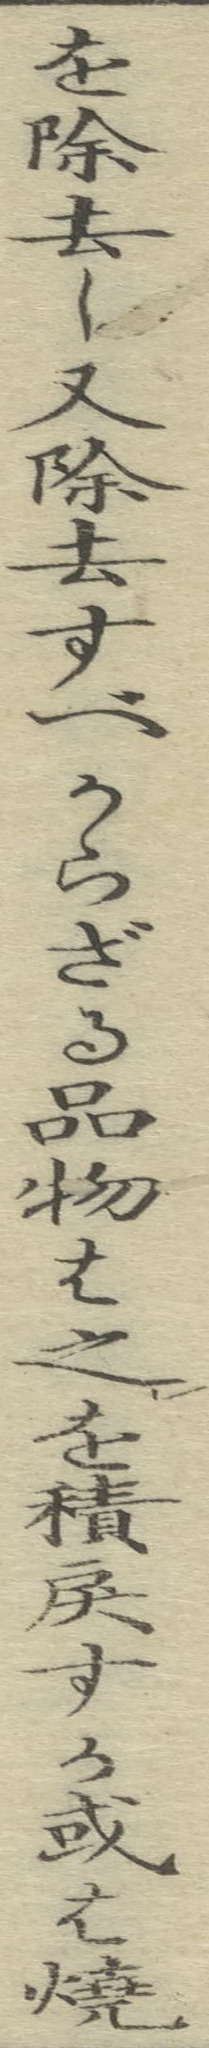を除去し又除去すべからざらる品物は之積戻すか或は焼
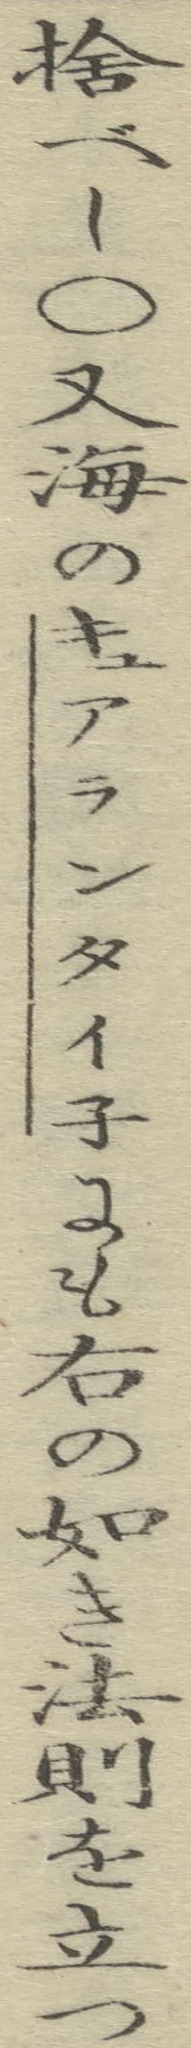捨べし〇又海のキュアランタイネにも右の如き法則を立つ
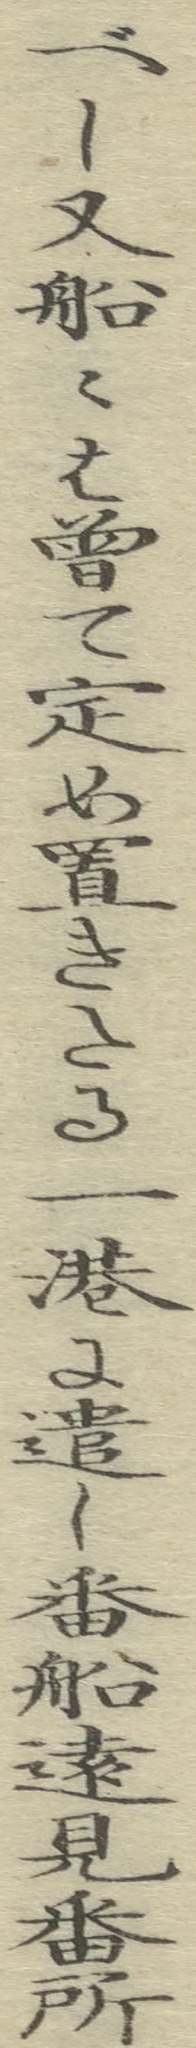べし又船々は曽て定め置きたる一港に遺し番船遠見番所
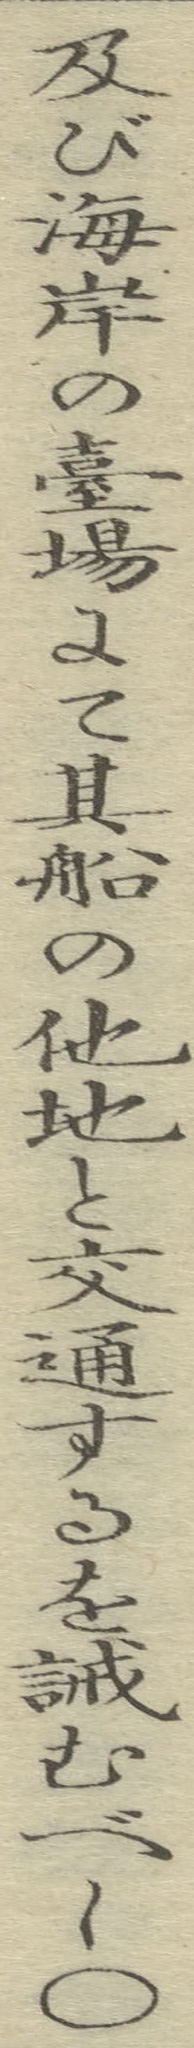及び海岸の臺場にて其船の他地と交通するを誡むべし〇
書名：官版疫毒預防説　全
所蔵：東京大学総合図書館 General Library in the University of Tokyo, JAPAN
